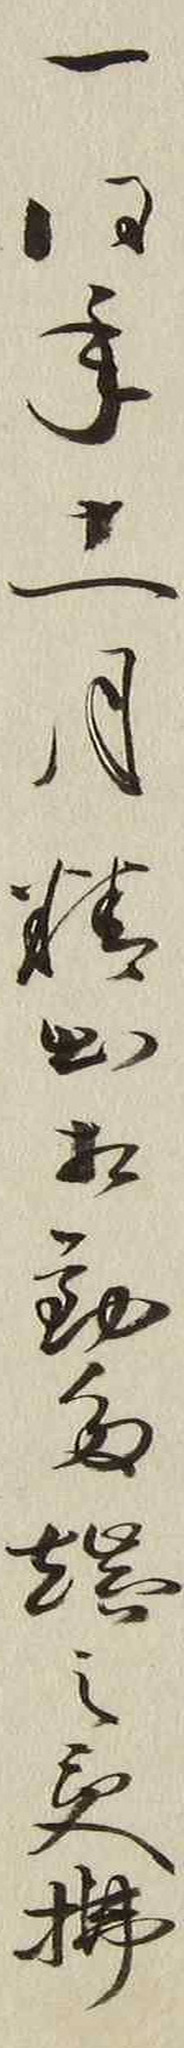一同年十一月精出相勤多端之受払
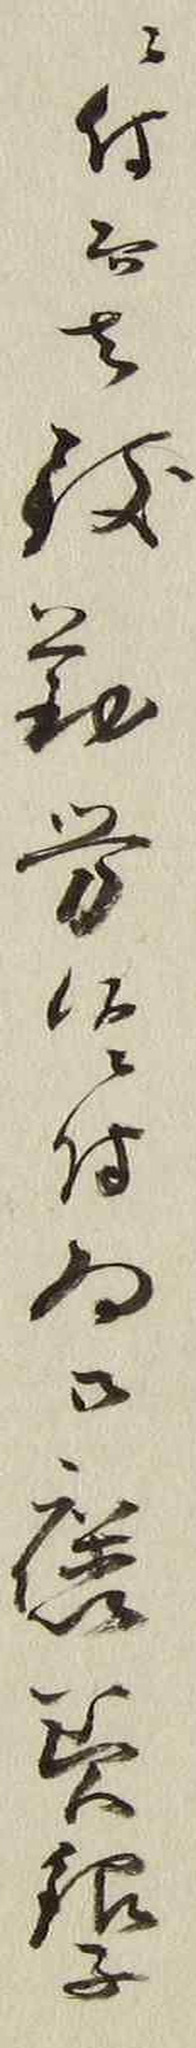ニ付而は致勤労候ニ付為御褒美銀子
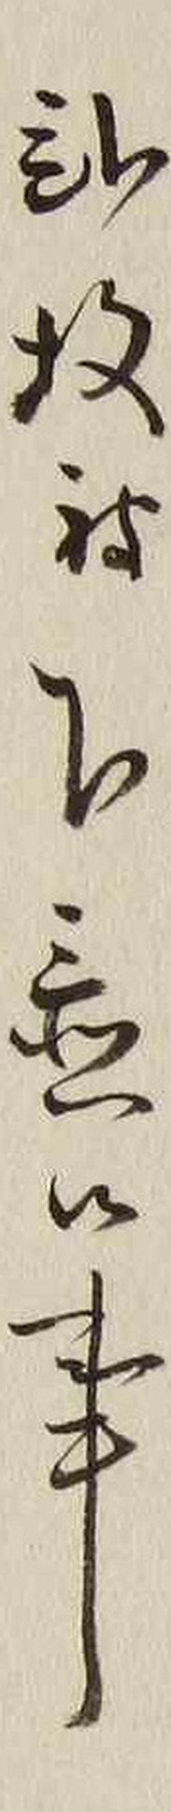弐枚被下置候事
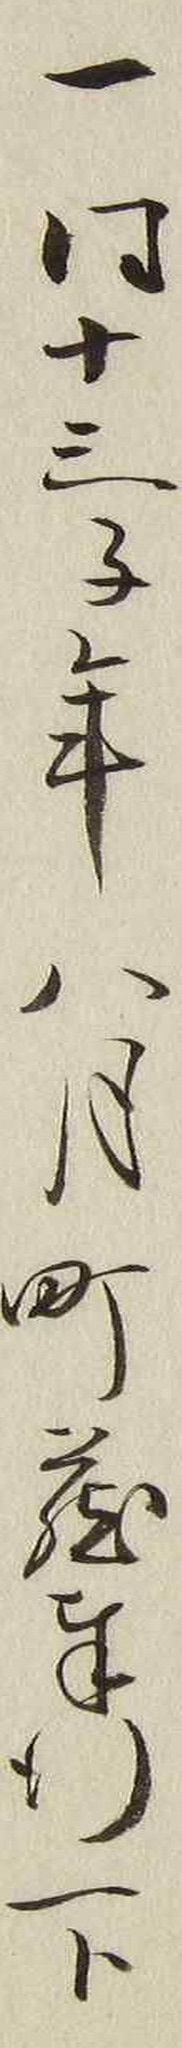一同十三子年八月町蔵奉行一ト
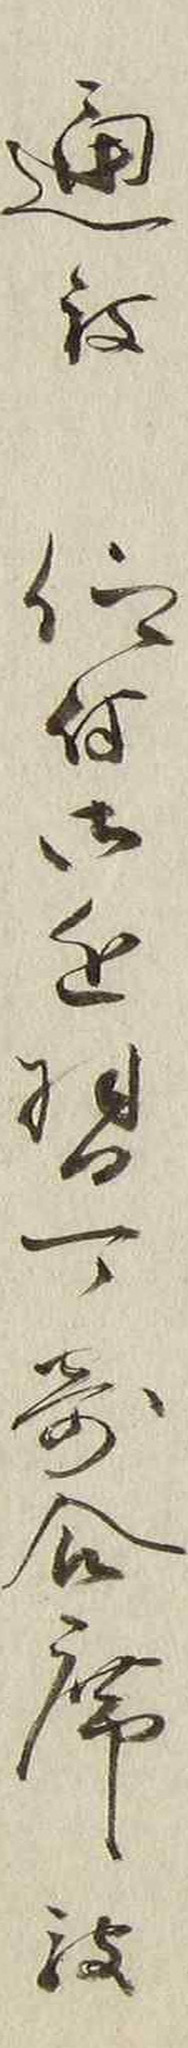通被仰付御近習一ノ寄合席被
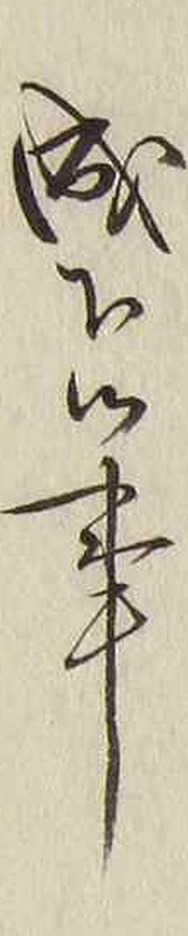成下候事

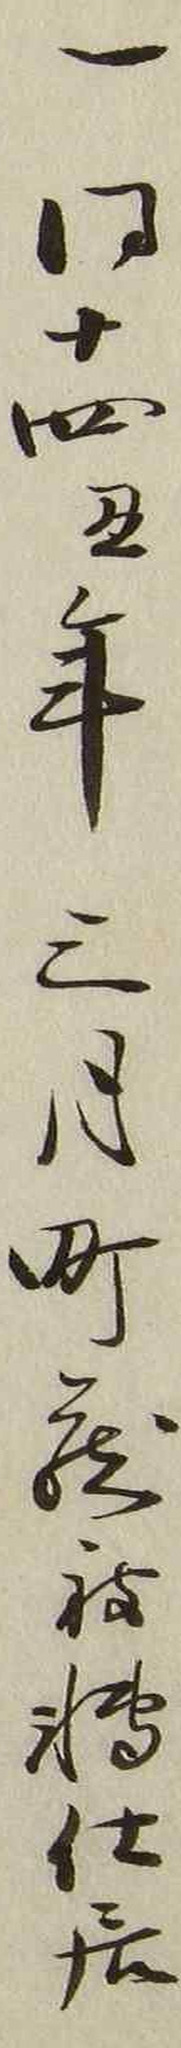一同十四丑年三月町蔵被転仕居
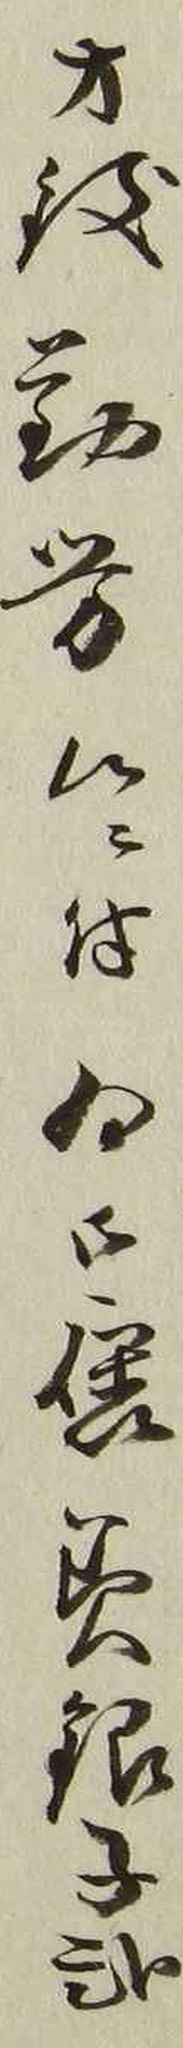方致勤労候ニ付為御褒美銀子弐
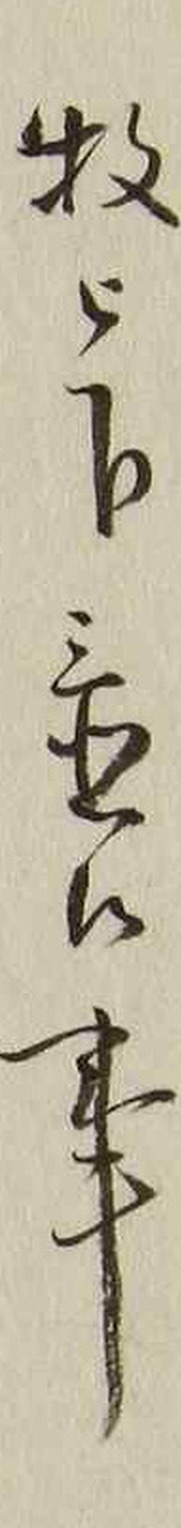枚被下置候事
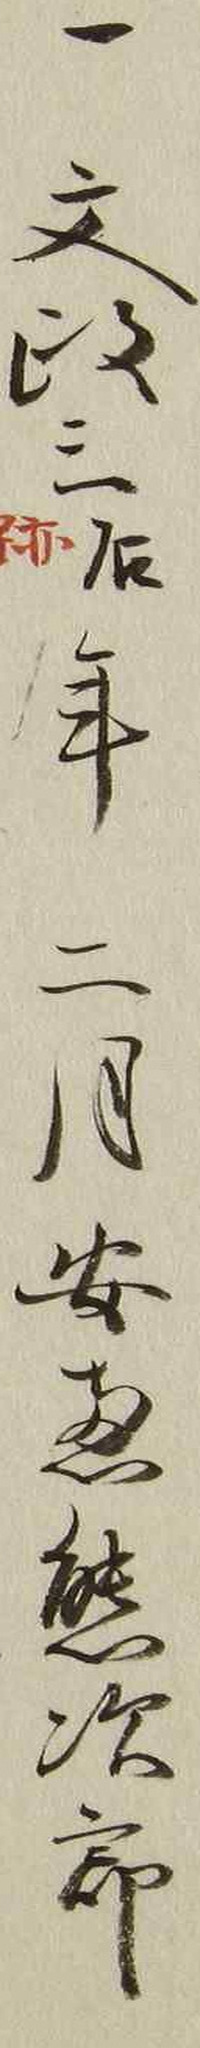一文政三辰年二月安恵態次郎
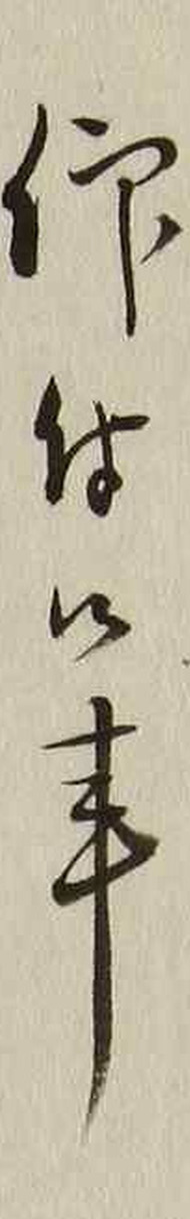仰付候事
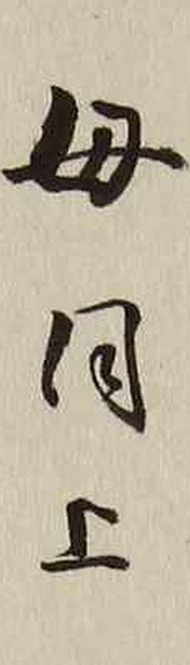母同上
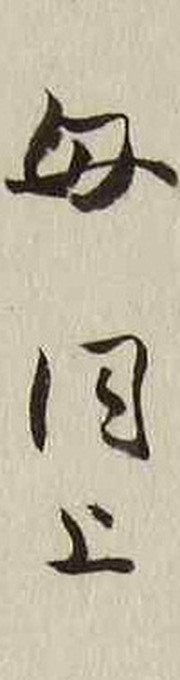母同上
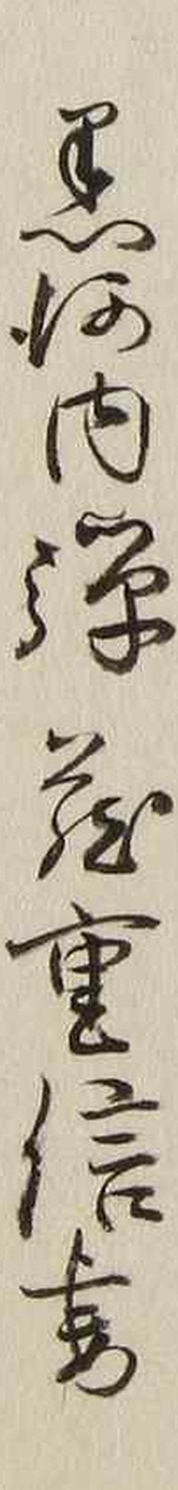黒河内弾蔵重信妻
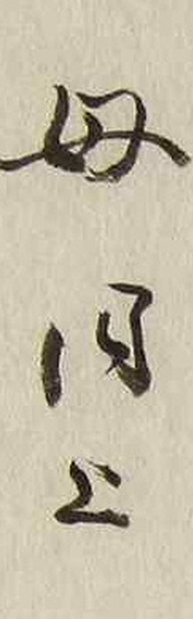母同上

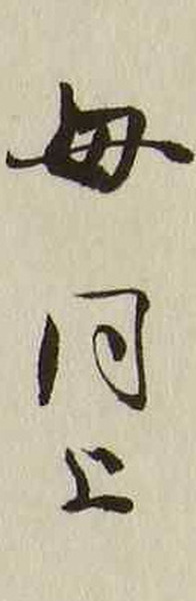母同上
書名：諸士系譜　巻之163　な之部5
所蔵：会津若松市立会津図書館
